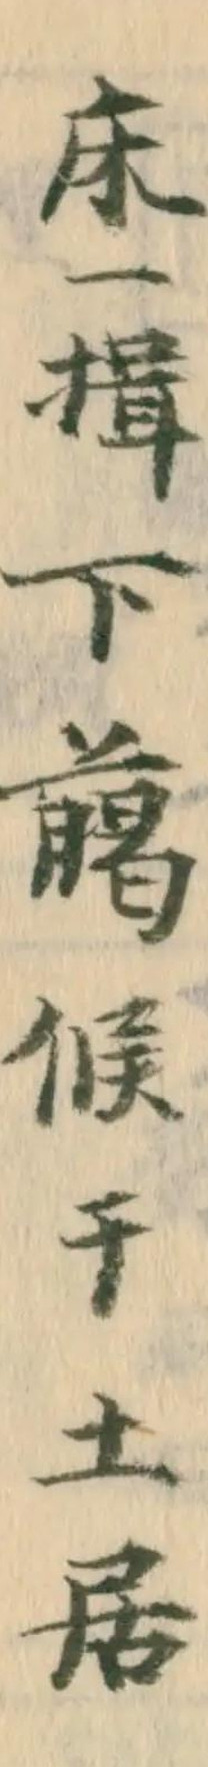床一揖下臈候于土居
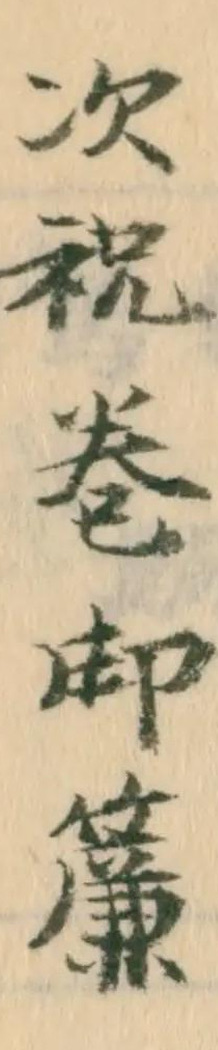次祝巻御簾
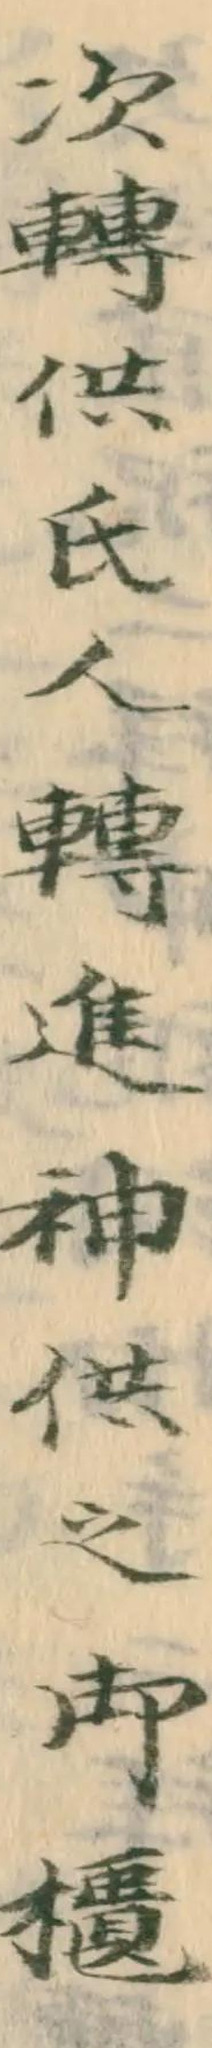次轉供氏人轉進神供之御櫃
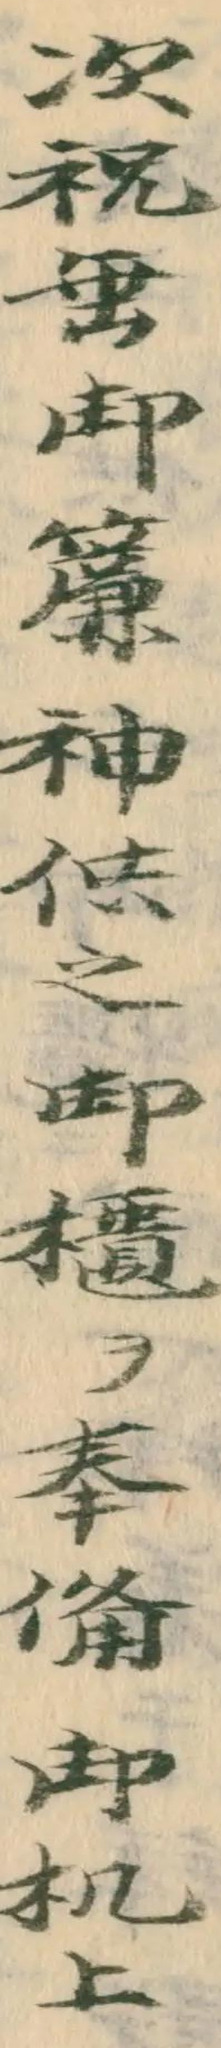次祝垂御簾神供之御櫃ヲ奉備御机上
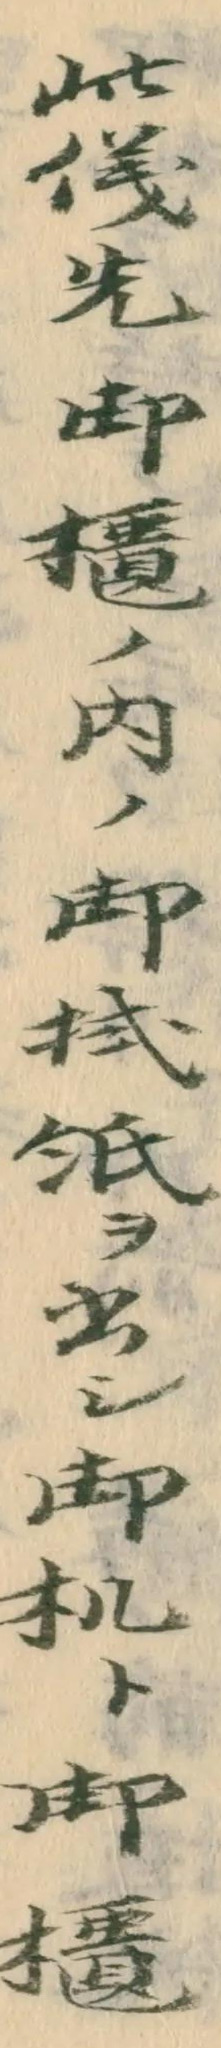此儀先御櫃ノ内ノ御拭紙ヲ出シ御机ト御櫃
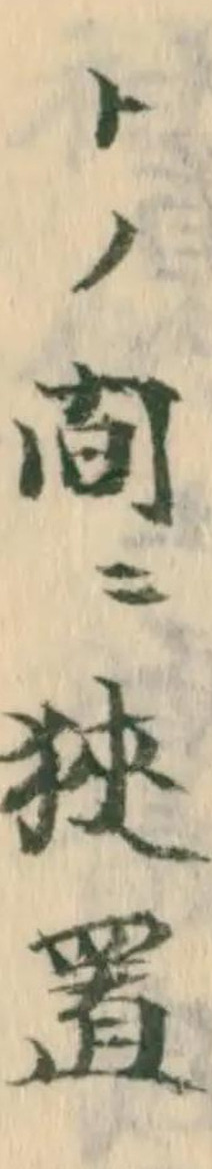トノ間ニ狭置

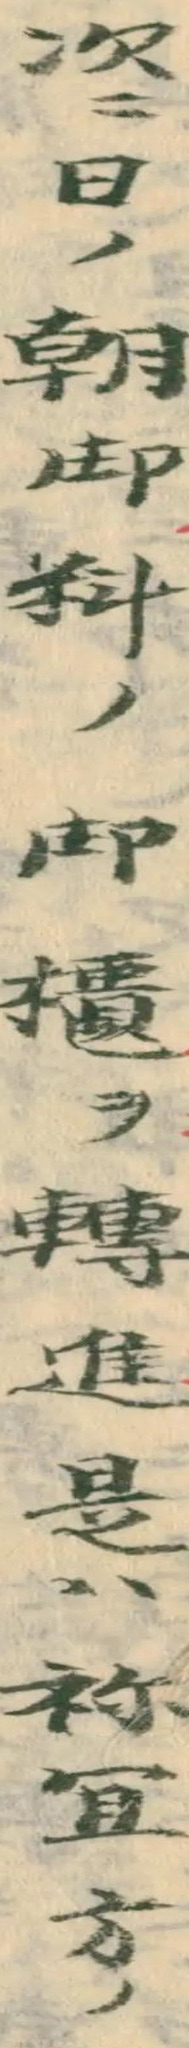次ニ日ノ朝御料ノ御櫃ヲ転進是ハ禰宜方ノ
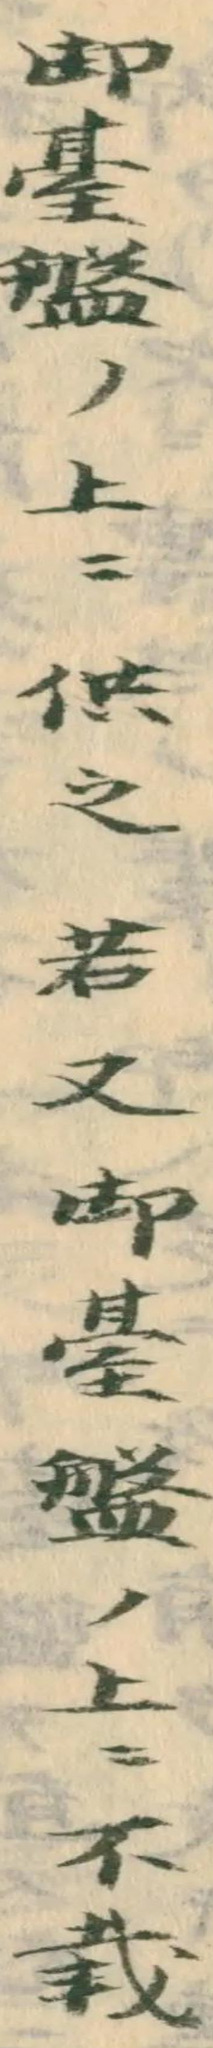御台盤ノ上ニ供之若又御台盤之上ニ不裁
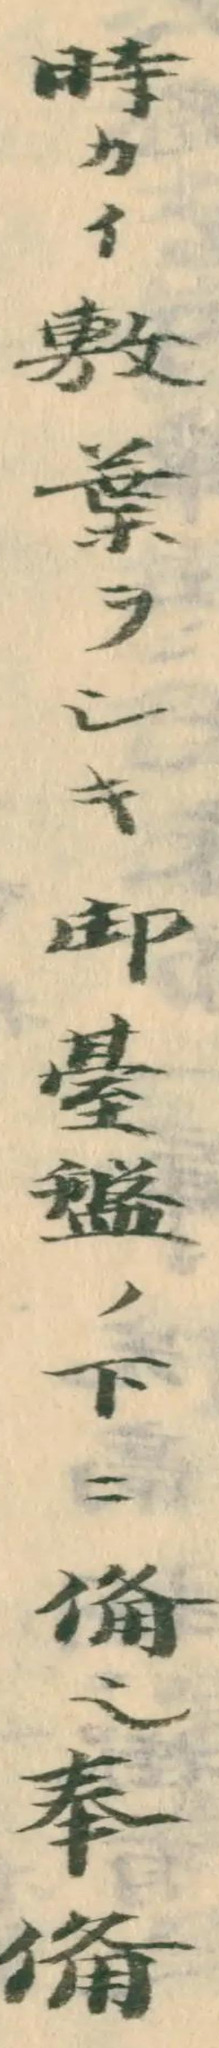時カイ敷葉ヲシキ御台盤ノ下ニ備也奉備
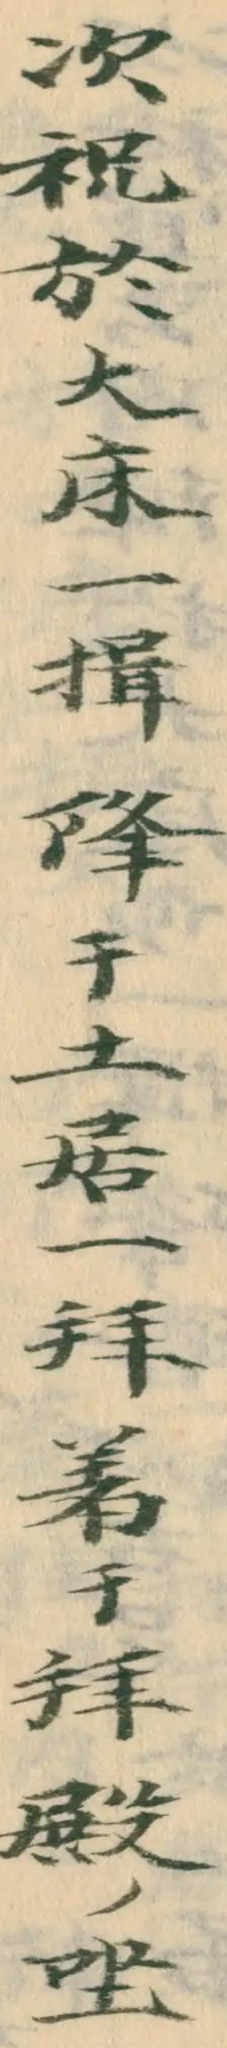次祝於大床一揖降于土居一拝着并拝殿ノ坐
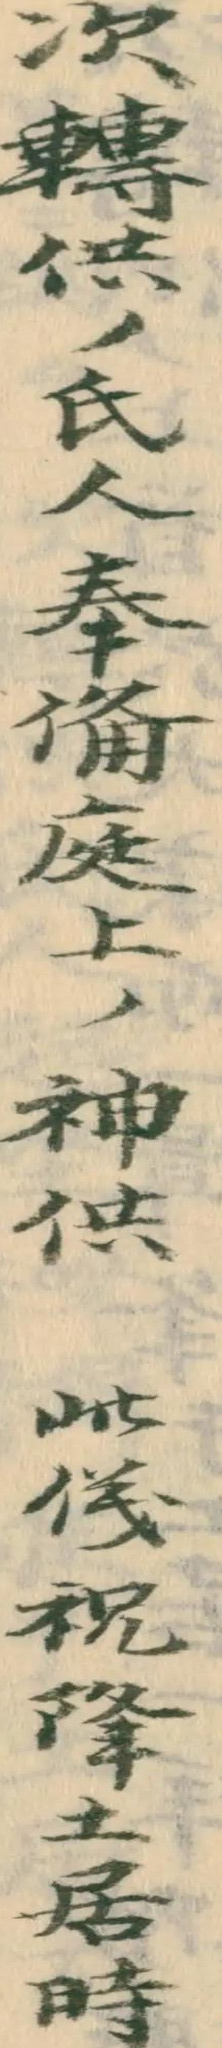次転供ノ氏人奉備庭上ノ神供此儀祝降土居時
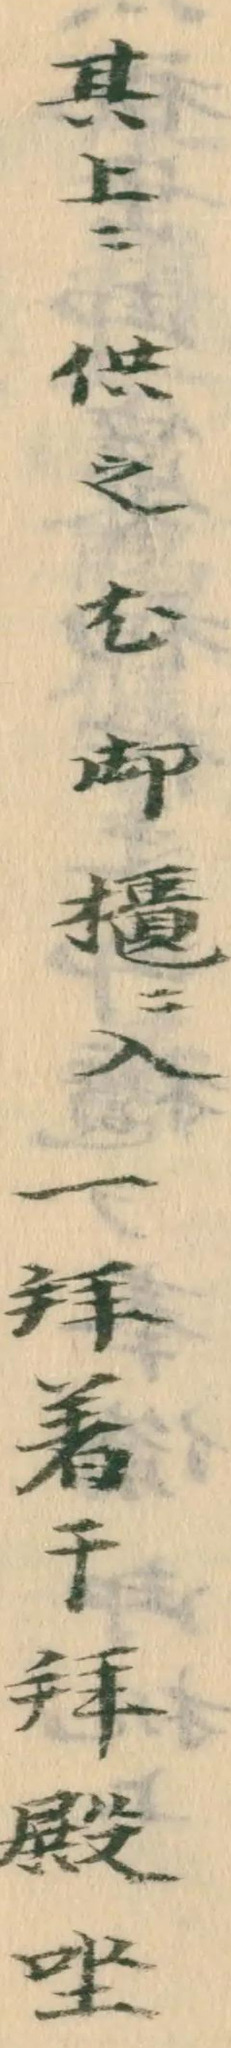其上ニ供之尤御櫃ニ入一拝着于拝殿坐
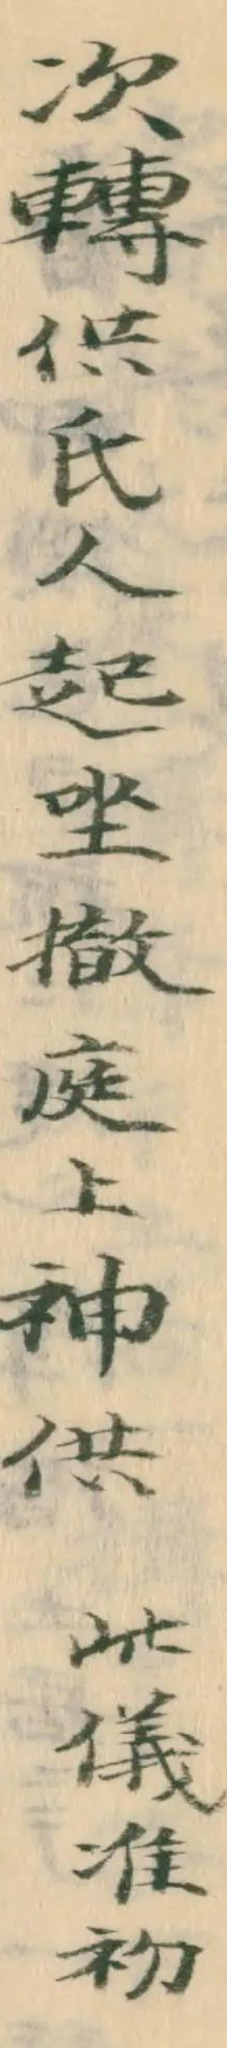次転供氏人起坐撤庭上神供此儀准初
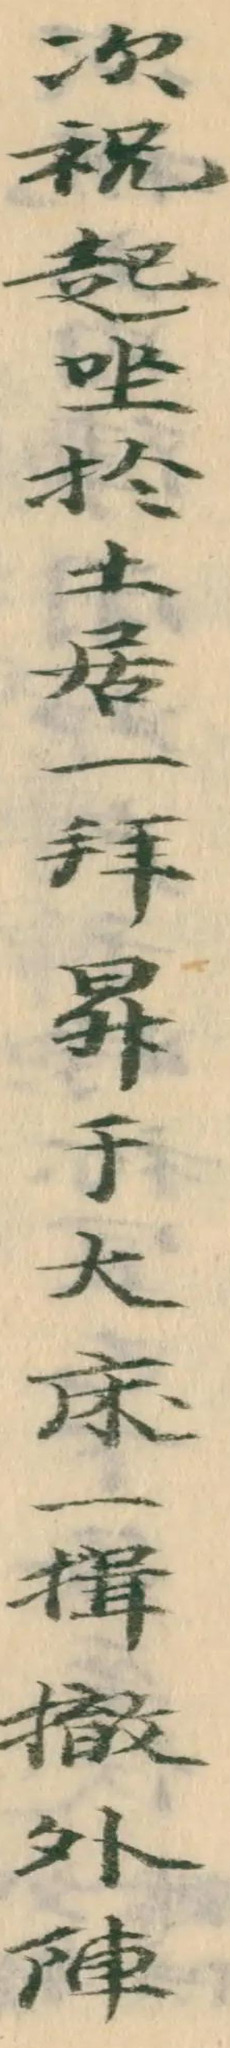次祝起坐於土居一拝昇于大床一揖撤外陣
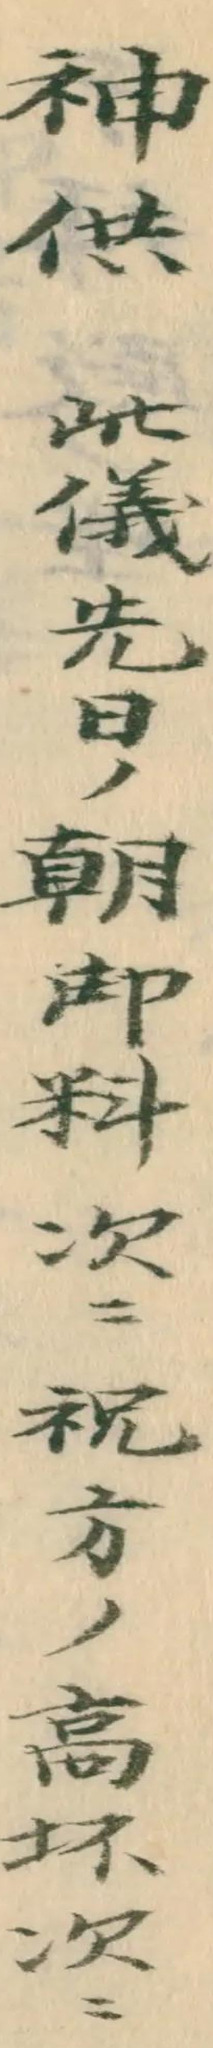神供此儀先日ノ朝御料次ニ祝方ノ高坏次ニ
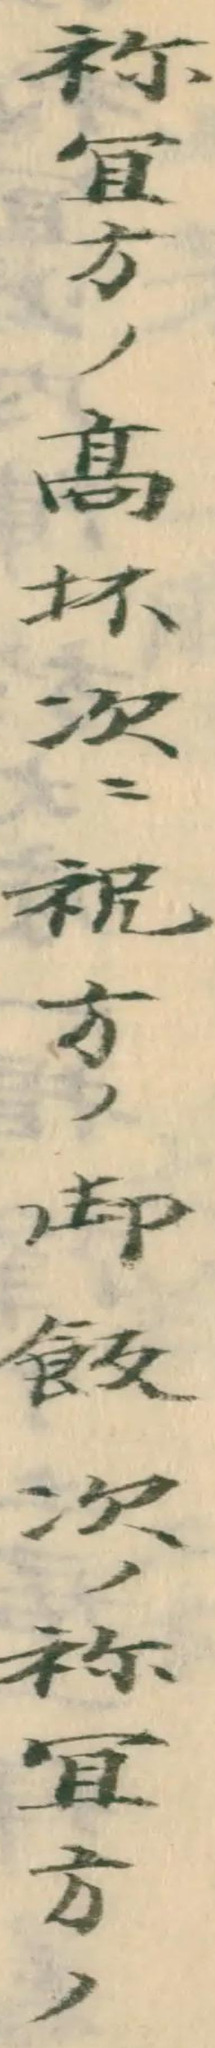禰冝方ノ高坏次ニ祝方ノ御飯次ノ禰宜方ノ
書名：賀茂社記録. 第5冊
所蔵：国立国会図書館 National Diet Library, JAPAN
